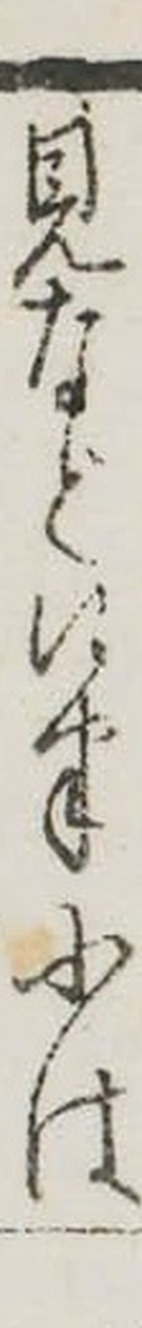見など候半には
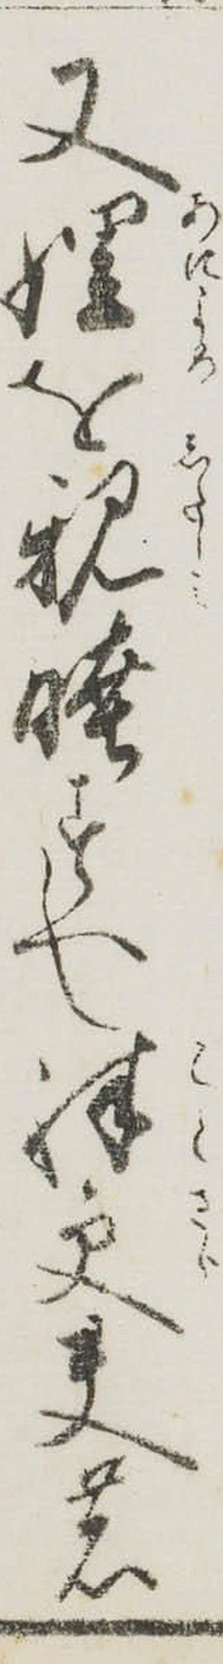又嫂を親睦すへし殊更夫の
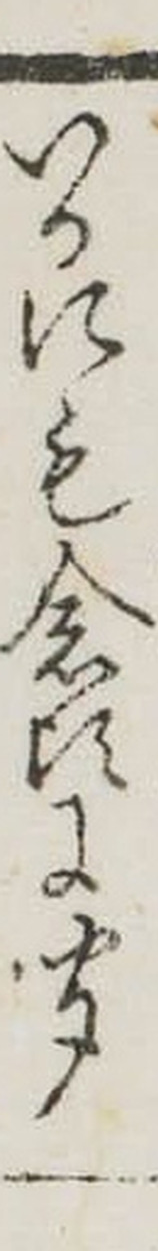いかにも念頃に聞
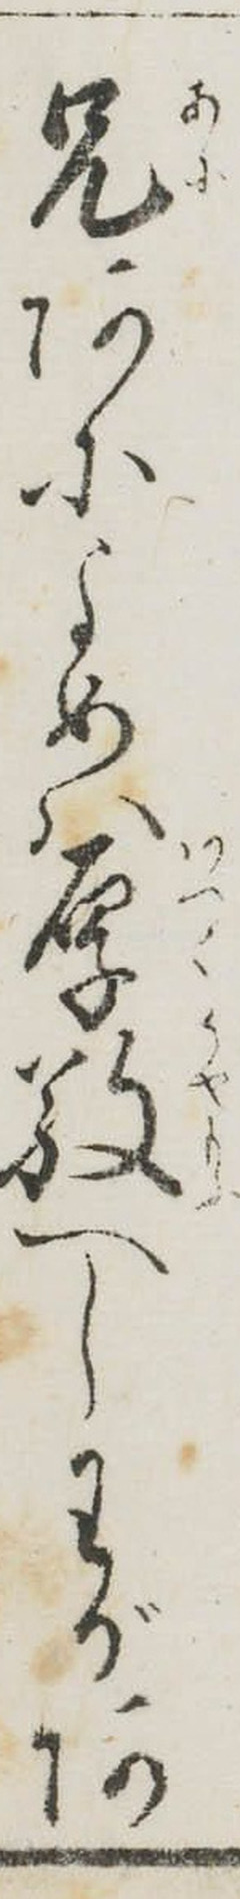兄あによめは厚敬へしわがあ
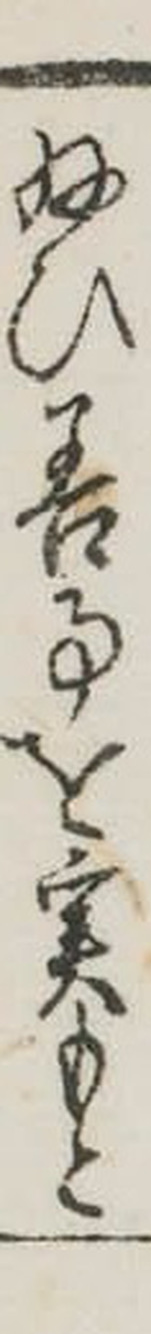給ひ善事を実もと
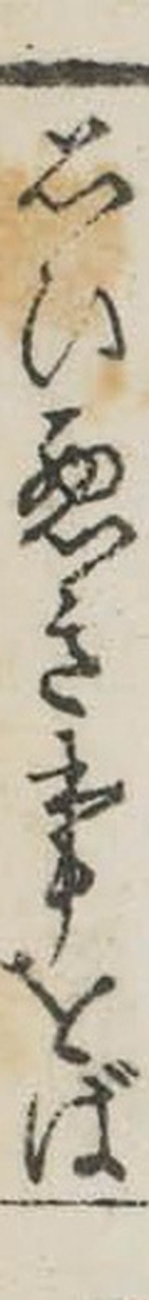思ひ悪き事をば
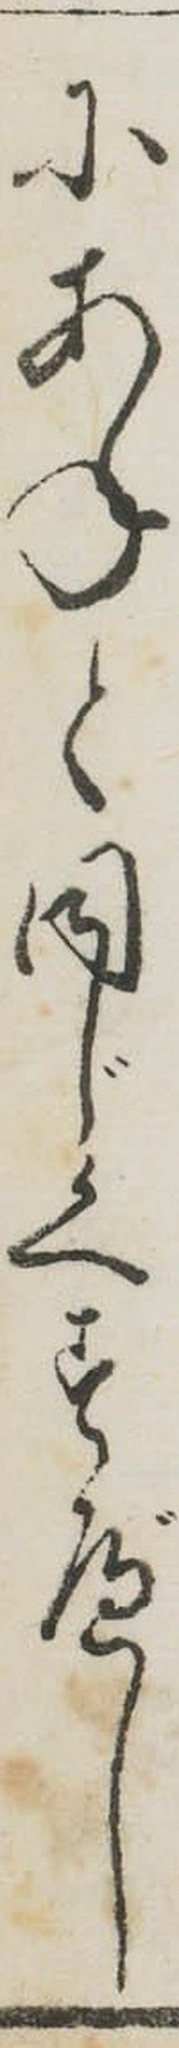にあねと同じくすべし

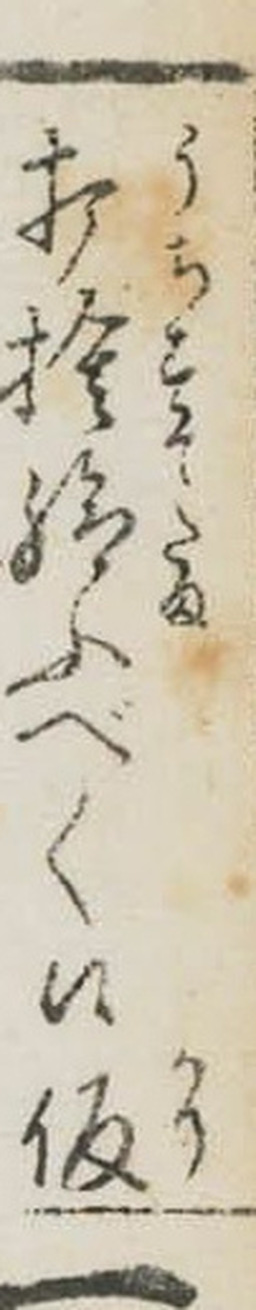打捨給ふべく候仮
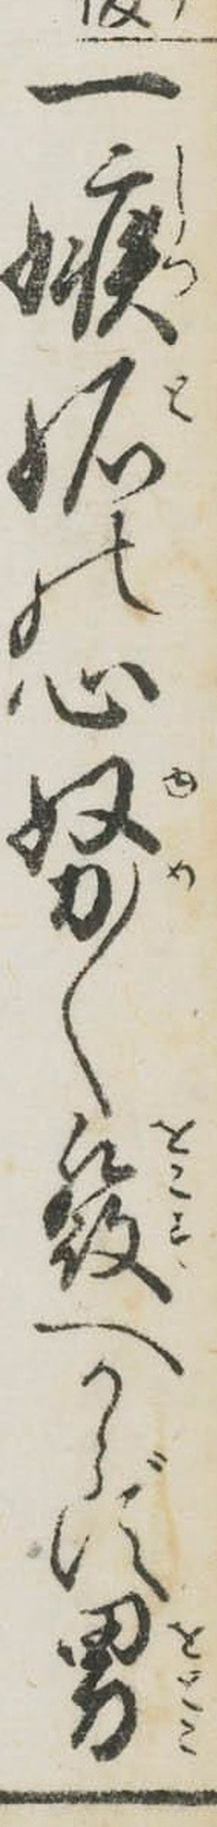一嫉妬の心努〳〵発へからず男
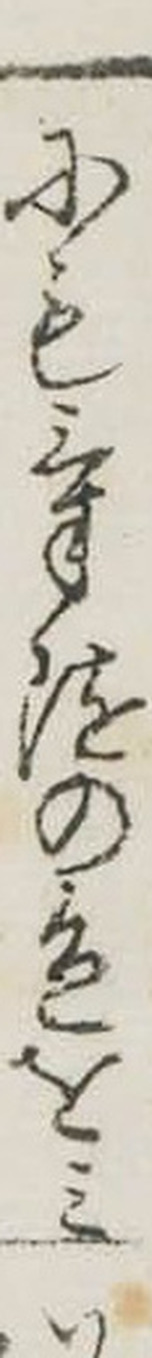にも気随の色をみ
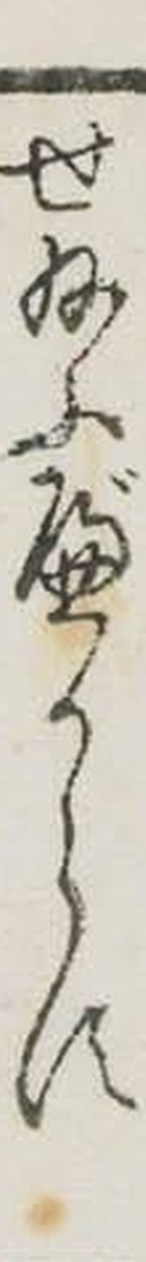せ給ふべからす
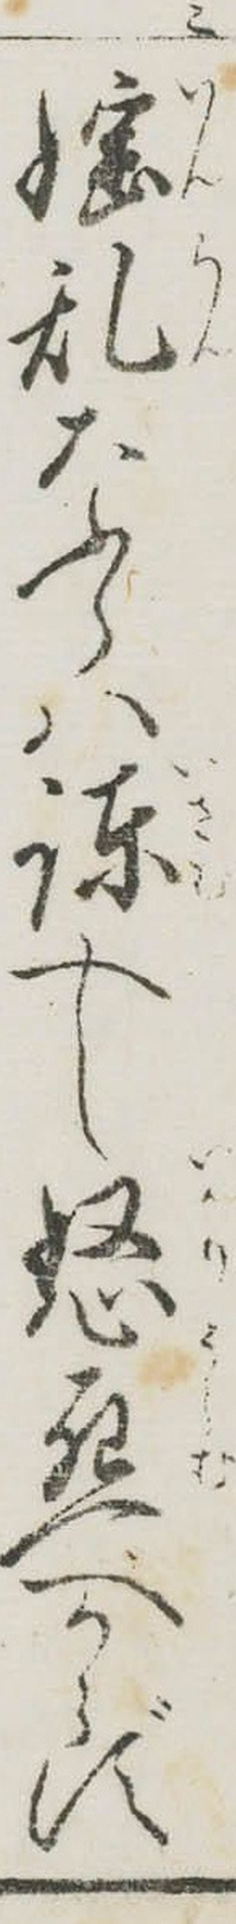淫乱ならは諫へし怒怨へからず
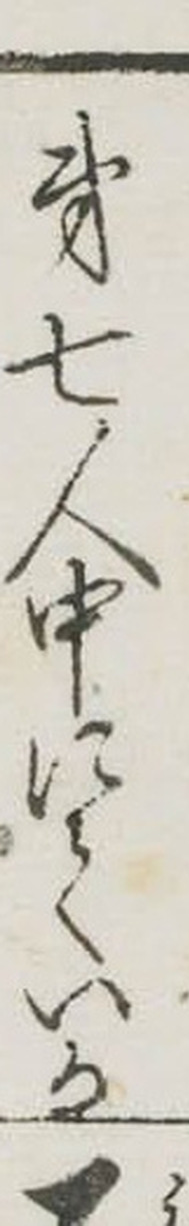第七人中にていか
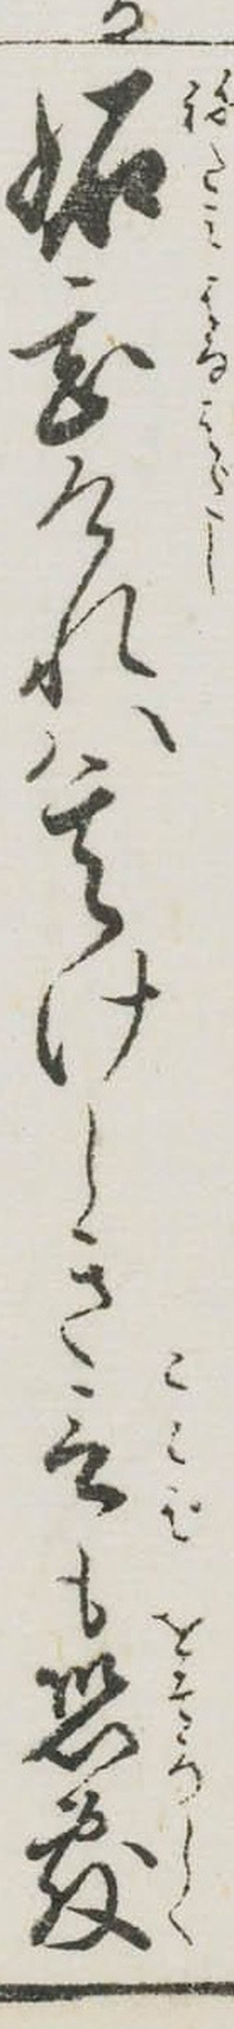妬甚けれは其けしき言も恐敷
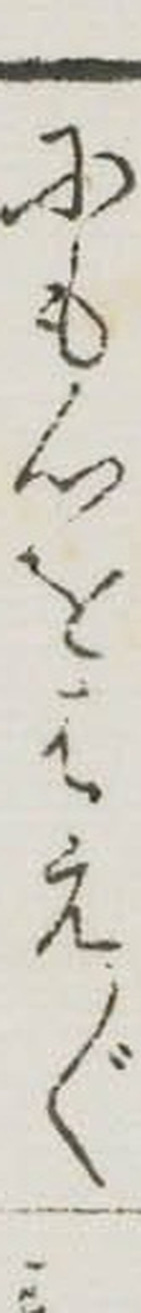にも心をはえ〴〵
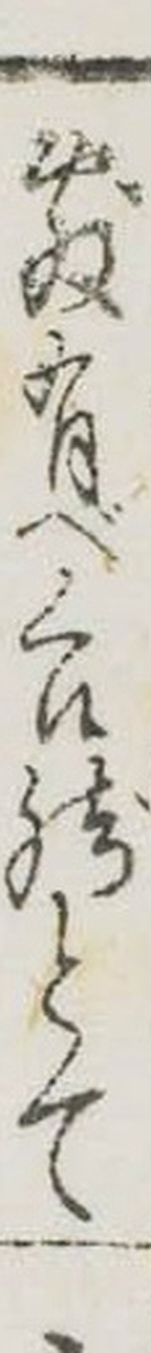敷有べく候然とて
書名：女大学
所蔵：東京学芸大学教育コンテンツアーカイブ
